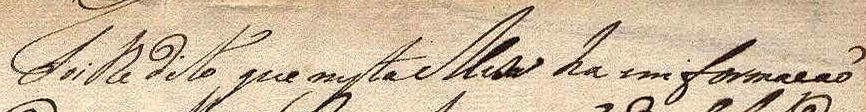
Foilhe dito, que nesta Mesa ha imformaçaõ
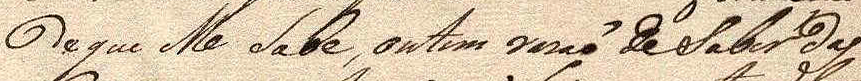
de que elle Sabe, ou tem razaõ de Saber das
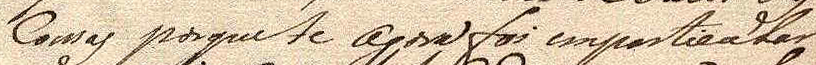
Cousas porque te agora foi em particaLar
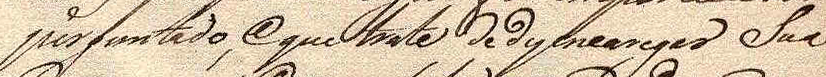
perguntado, E que trate de desencaregar Sua
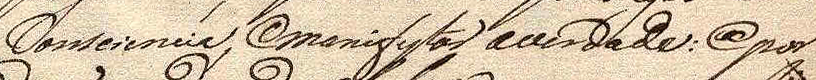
Consciencia, E manifestar a verdade: E por
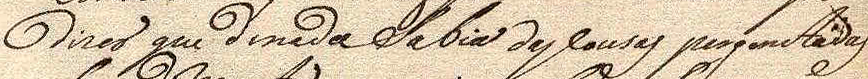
dizer que de nada Sabia das cousas perguntadas
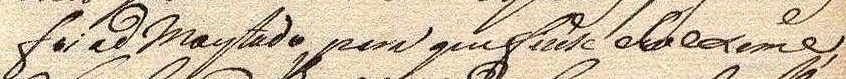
foi admoestado para que fizese Seu exame
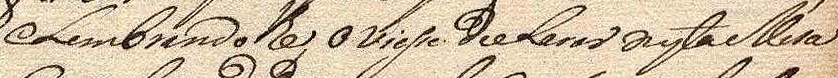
e Lembrandolhe, o viesse decLarar nesta Mesa
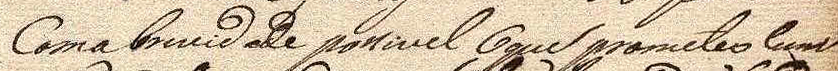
Com a brevidade possivel O que prometeo Cum
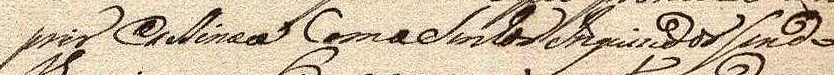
prir E asinou Com o Senhor Inquisidor sendo
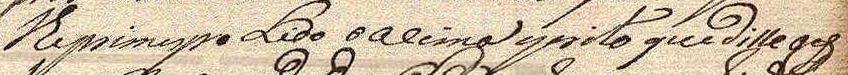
lhe primeyro Lido o acima escrito que disse o es
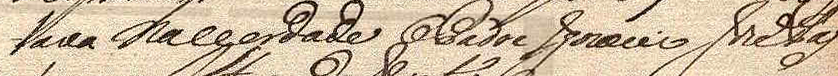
tava na verdade o Padre Inacio Joze Vas
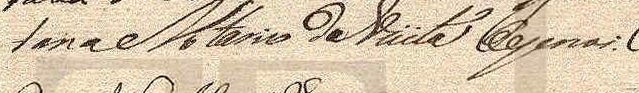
lara Notario da Visita o escrevi.
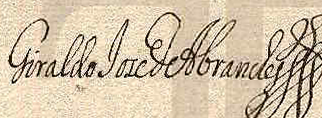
Giraldo Ioze de Abranches
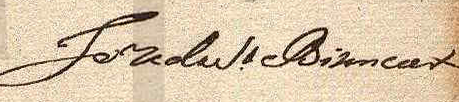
Joze da S.a Bitencort
